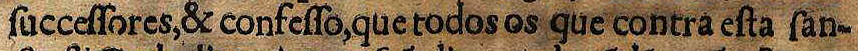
successores, & confesso, que todos os que contra esta san
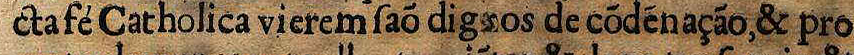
cta fé Catholica vierem saõ dignos de cōdēnação, & pro
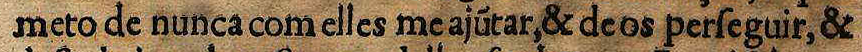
meto de nunca com elles me ajūtar, & de os perseguir, &
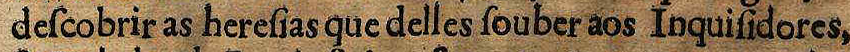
descobrir as heresias que delles souber aos Inquisidores,
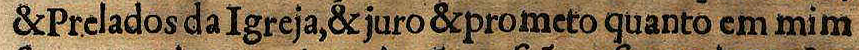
& Prelados da Igreja, & juro, & prometo quanto em mim
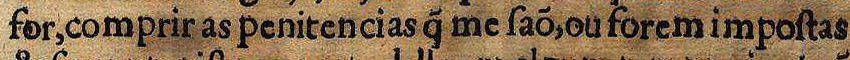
for, comprir as penitencias q̄ me saõ, ou forem impostas
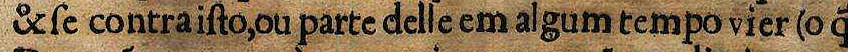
& se contra isto, ou parte delle em algum tempo vier (o q̄
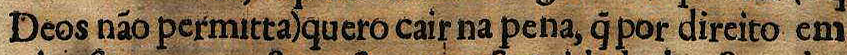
Deos não permitta) quero cair na pena, q̄ por direito em
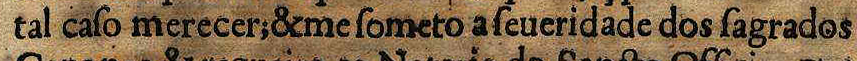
tal caso merecer; & me someto a seueridade dos sagrados
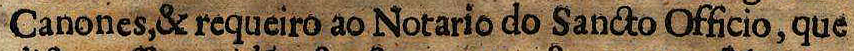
Canones, & requeiro ao Notario do Sancto Officio, que
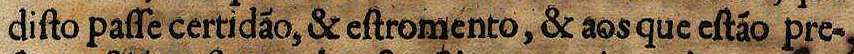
disto passe certidão, & estromento, & aos que estão pre
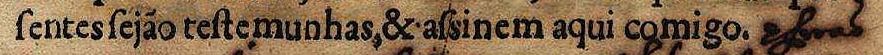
sentes sejão testemunhas, & assinem aqui comigo. E foraõ
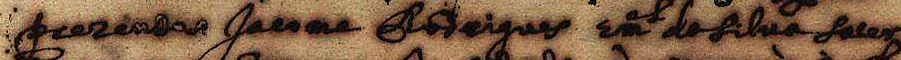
prezentes Jacome Rodrigues E mel da silua sacer
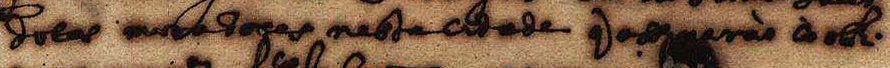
dotes moradores nesta cidade q̄ assinarão c̄o R.
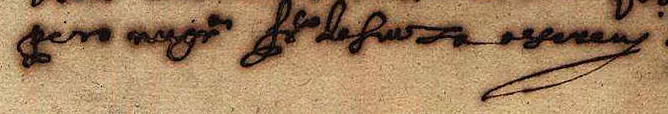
pero nugra frco de suoza o escreuj.
